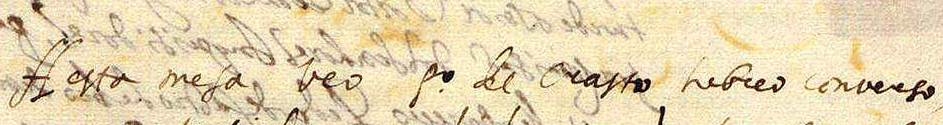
A esta mesa veo po de Crasto hebreo converso,
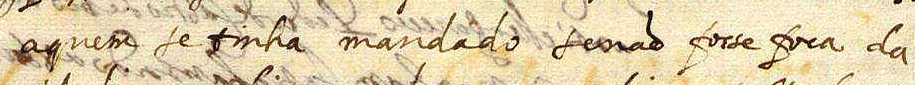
a quem se tinha mandado se naõ fosse fora da
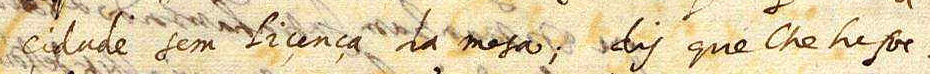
cidade sem Licença da mesa; dis que lhe he for
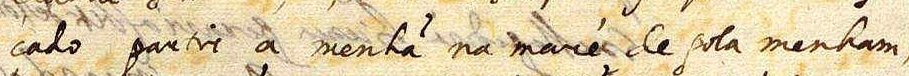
çado partir amenhā na maré de pola menham,
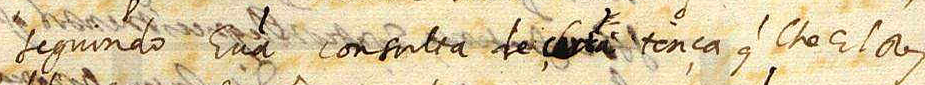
seguindo huā consulta de certa tença q̄ lhe El Rej
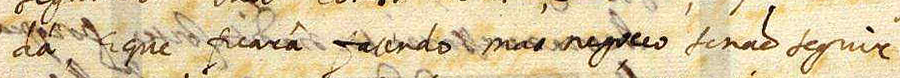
dá, E que ficará fazendo mao negoceo se naõ seguir
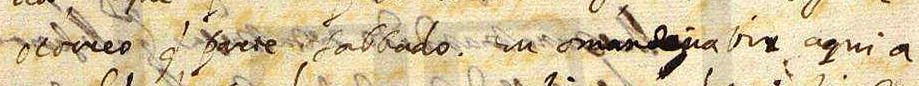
o correo q̄ parte sabbado, Eu o mandaua vir aqui a
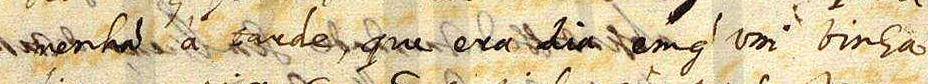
menhā à tarde, que era dia em q̄ vm vinha
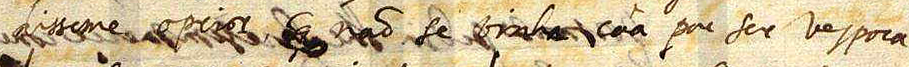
disseme o prior, q̄ naõ se vinha caa por ser vespora
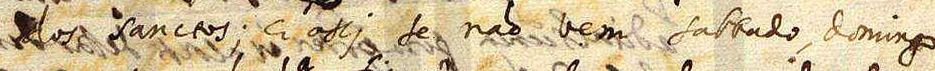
dos sanctos; E assj se naõ vem sabbado, domingo,
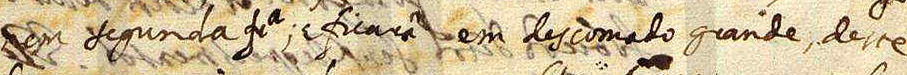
nem segunda fra; E ficará em descomado grande, deste
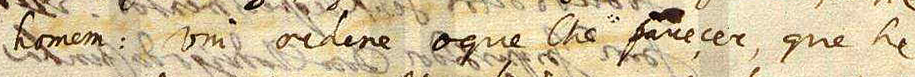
homem: vm ordene o que lhe parecer, que he
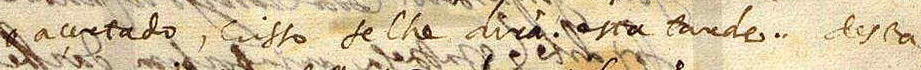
o acertado, E isso se lhe dirá. esta tarde. desta
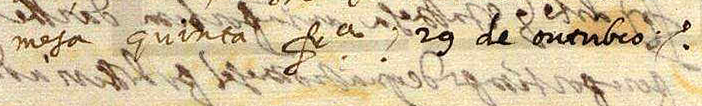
mesa quinta fr.a 29 de outubro./.
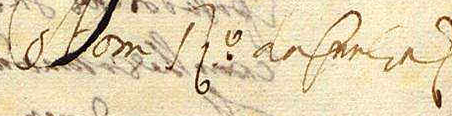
Dom R.o da Cunha
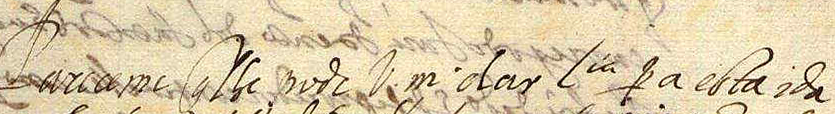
Pareceme q̄ lhe pode V. m. dar lça ꝑa esta ida
